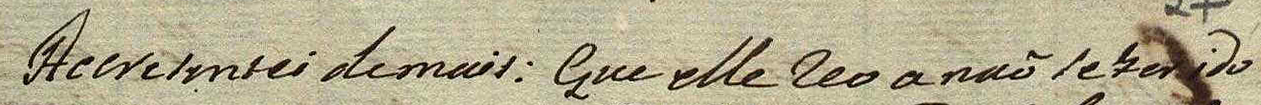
Accresentei de mais: Que elle Reo a naõ se ter ido
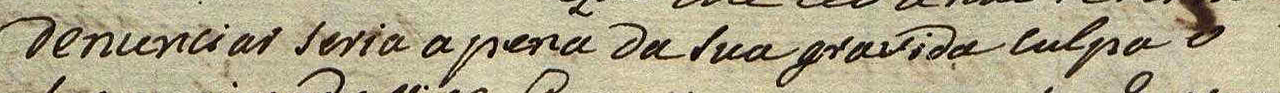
denunciar seria a pena da sua gravida culpa o
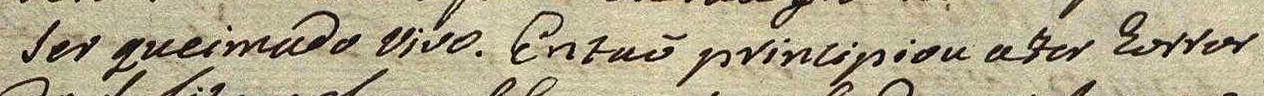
ser queimado vivo. Entaõ principiou a ter horror
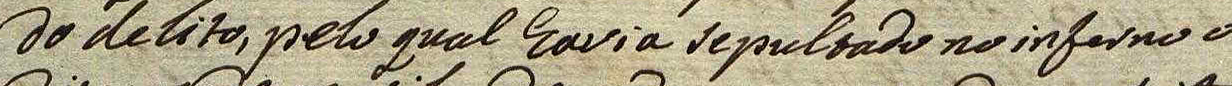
do delito, pelo qual havia sepultado no inferno o
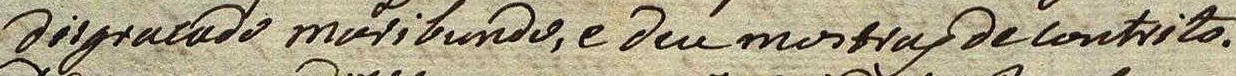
disgraçado moribundo, e deu mostras de contrito.
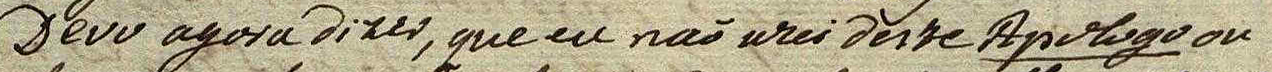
Deve agora dizer, que eu naõ uzei deste Apologo ou
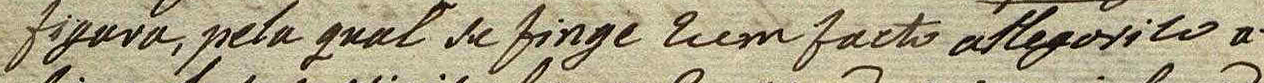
figura, pela qual se finge hum facto allegorico a
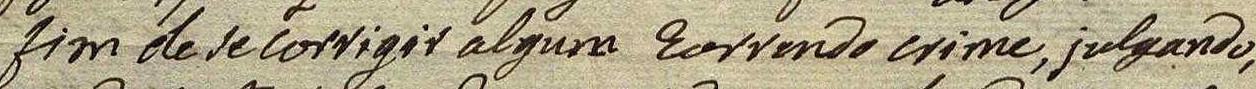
fim de se corrigir algum horrendo crime, julgando,
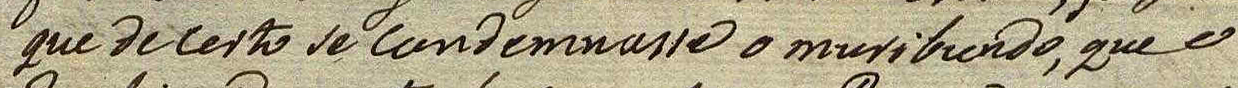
que de certo se condemnasse o muribundo, que o
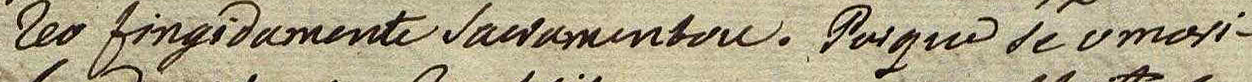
Reo fingidamente sacramentou. Porque se o mori
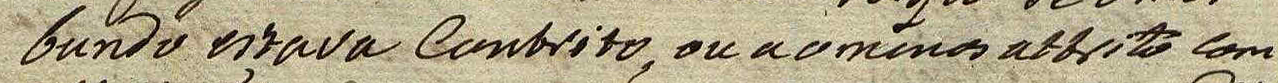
bundo estava Contrito, ou ao menos attrito com
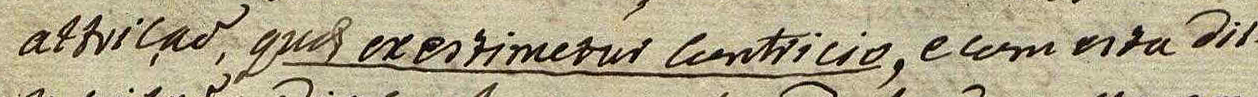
attriçaõ, que exestimetur contricio, e com esta dis
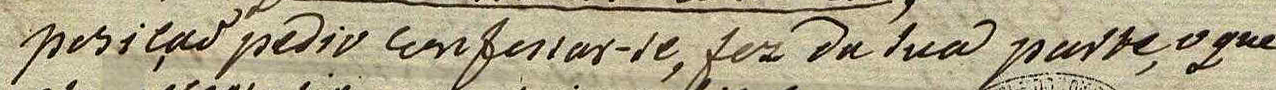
posiçaõ pediu confessar-se, fez da sua parte, o que
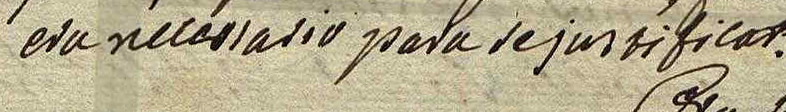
era necessario para se justificar.
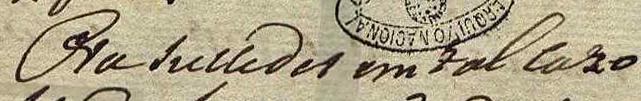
Pra succeder em tal cazo
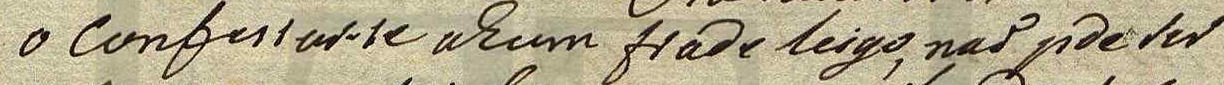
o confessar-se a hum frade leigo, naõ pde ser
